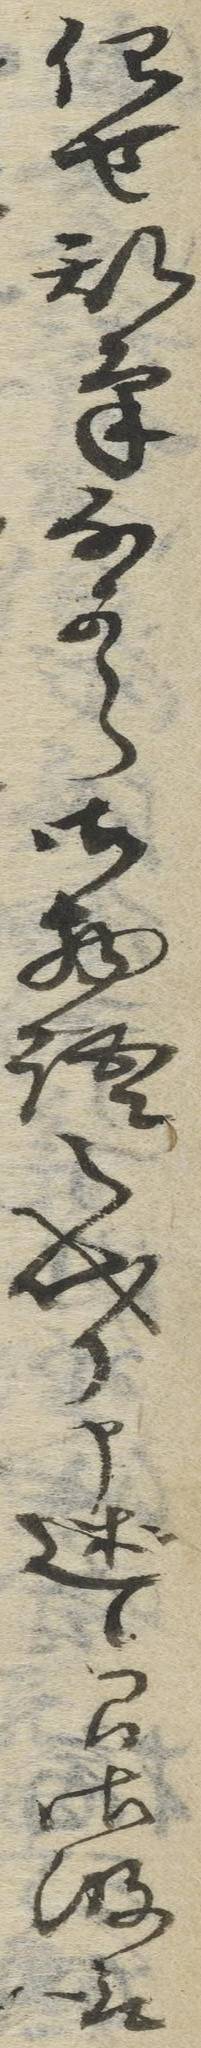任せ乱筆なから御物語之代り申述候間御汲取
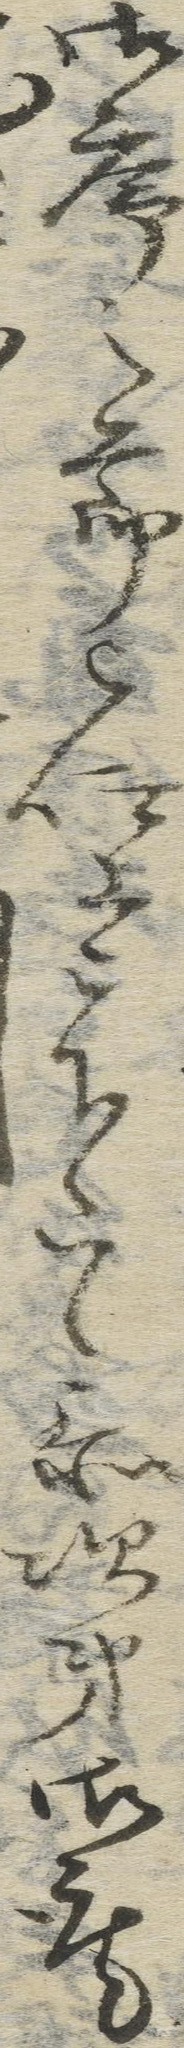御序之節被仰上被下候ハゝ忝次第御座候
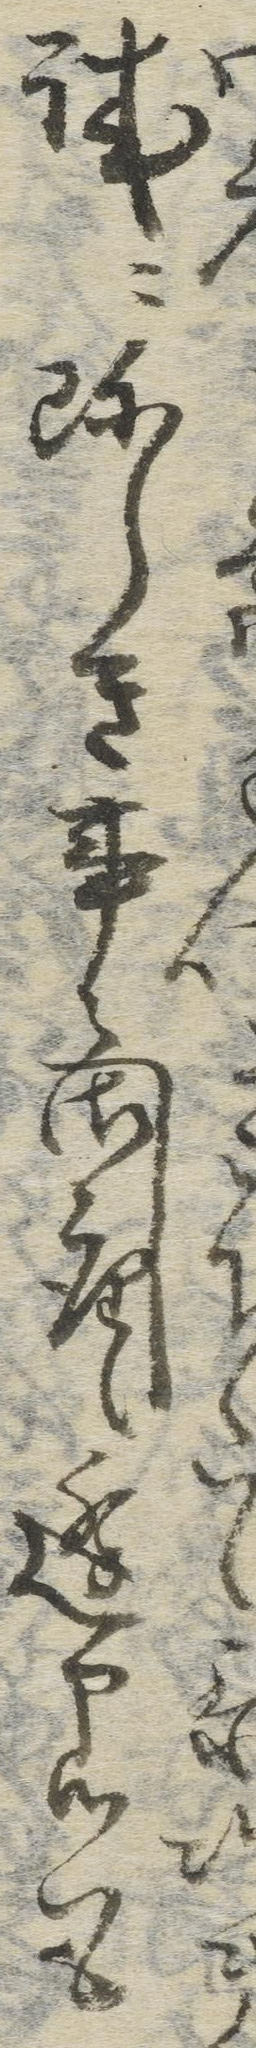誠二珍しき事二御座候逢申候以上
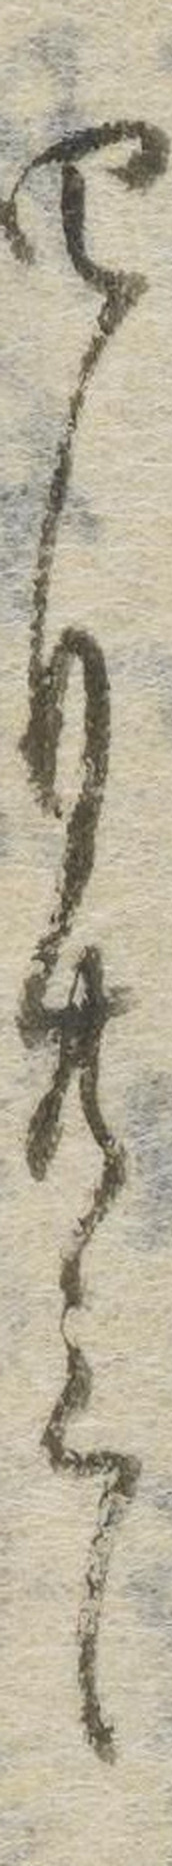四月廿三日
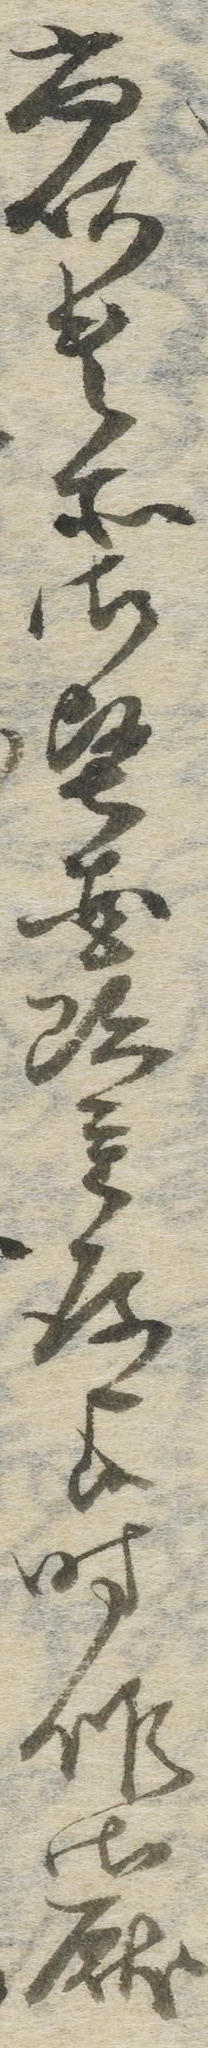尚以貴所御堅固珍重存申候時候御厭
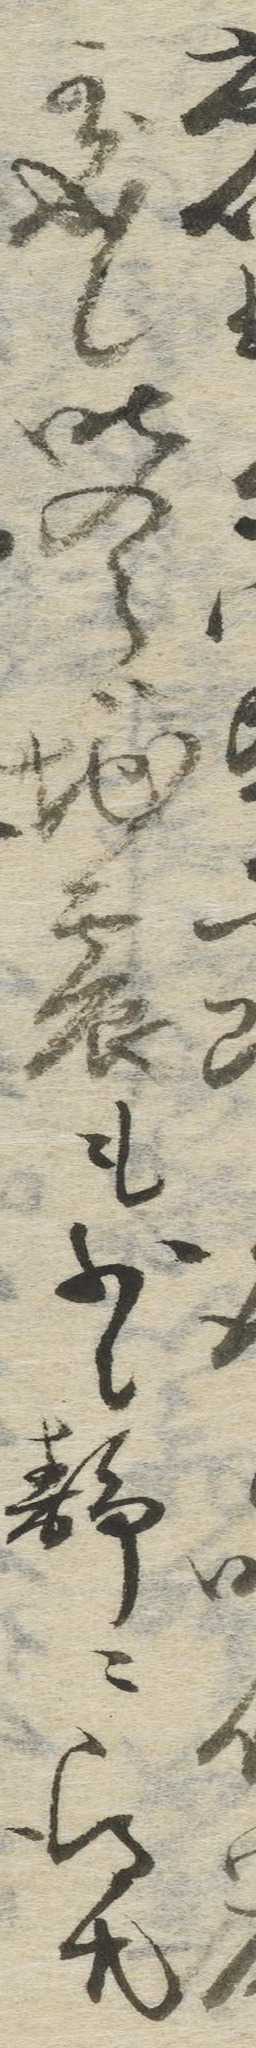可被成候昨今ハ地震も少々静二候得共
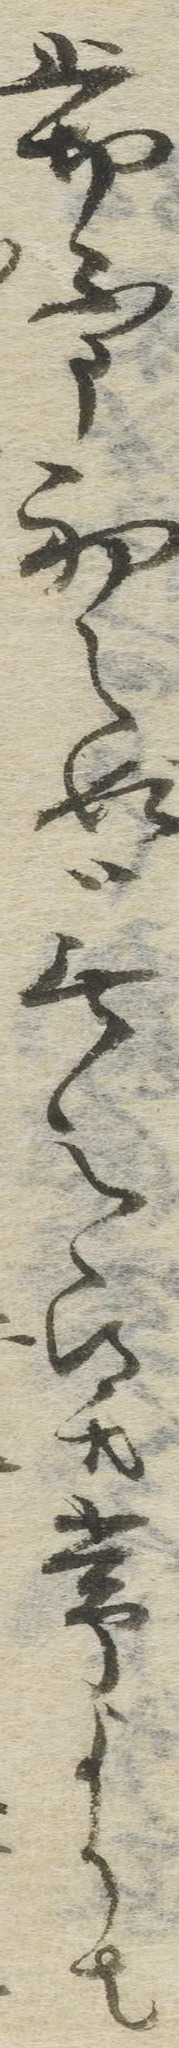止切不申初之如ハ無之候得共常よりは
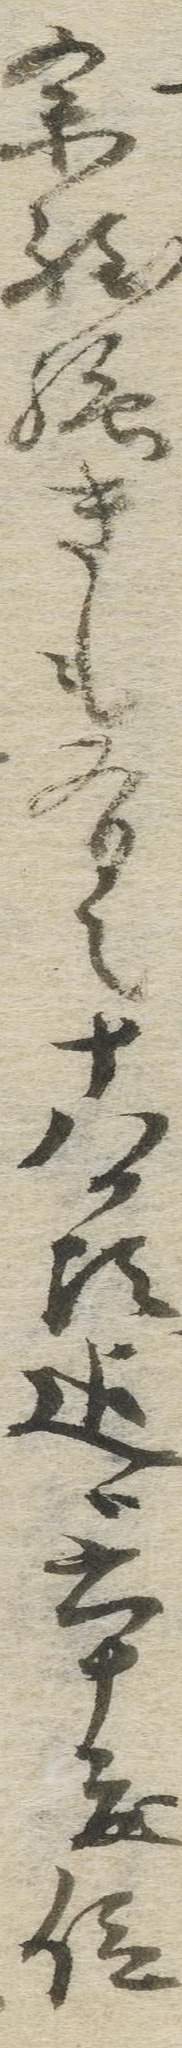余程強きも有之十八日頃迄ハ右申度位
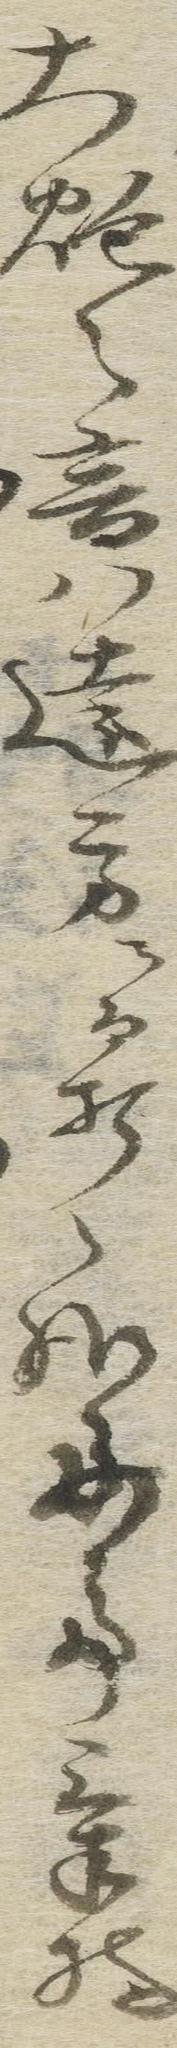大炮之音ハ遠方二而折々始めて気持
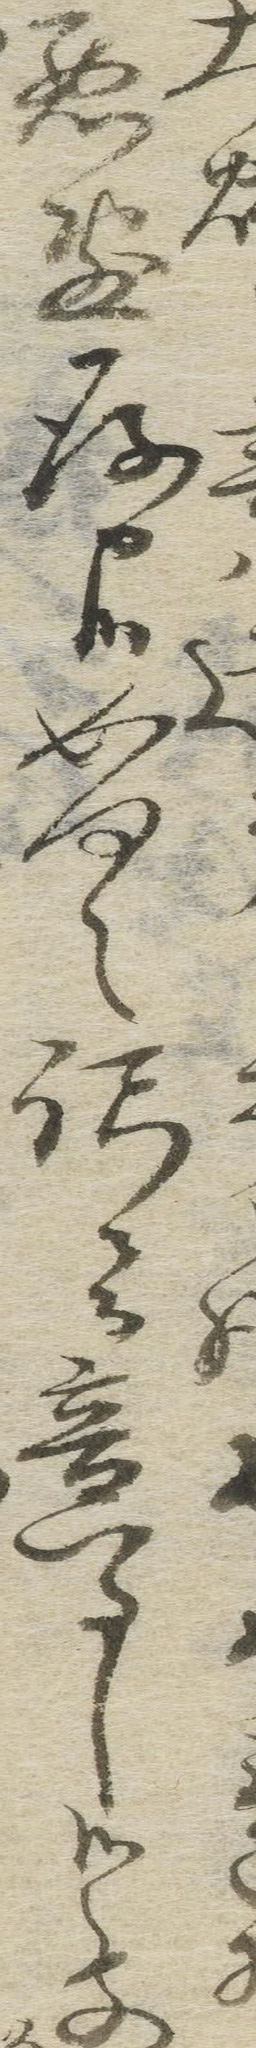悪敷存申候如何之訳二而音いたし候ものか
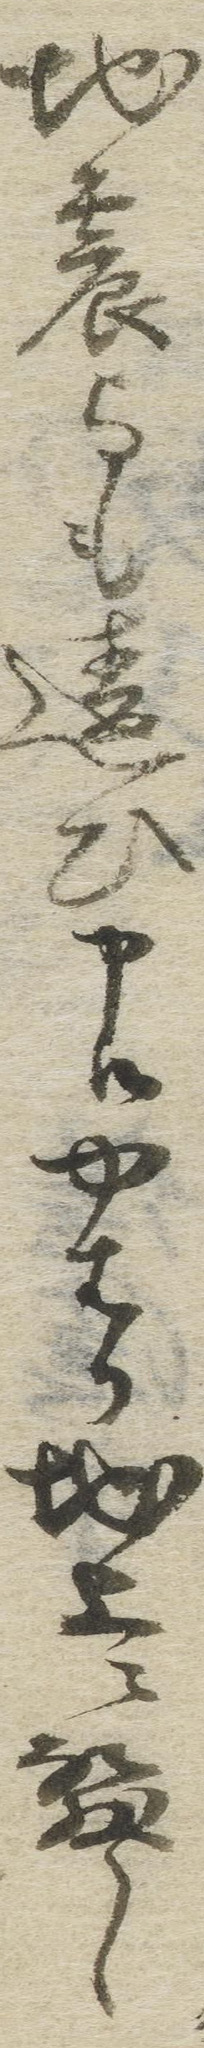地震とも違ひ申候やはり地上二発し
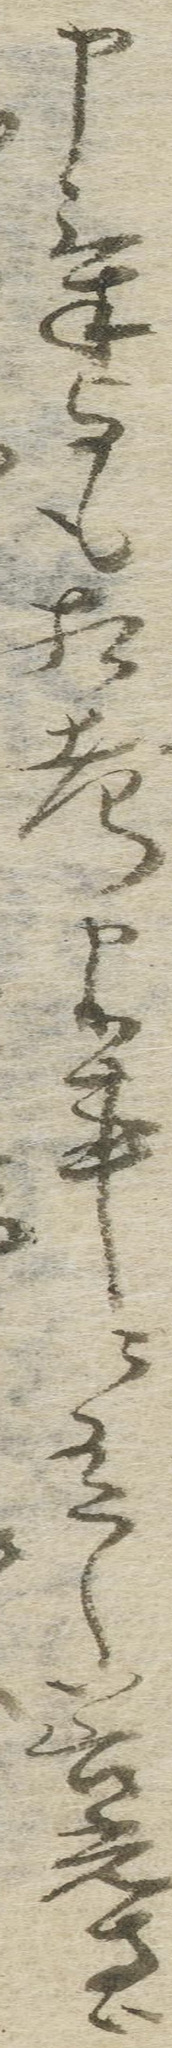申候気とも相考申候事二有之善光寺ハ
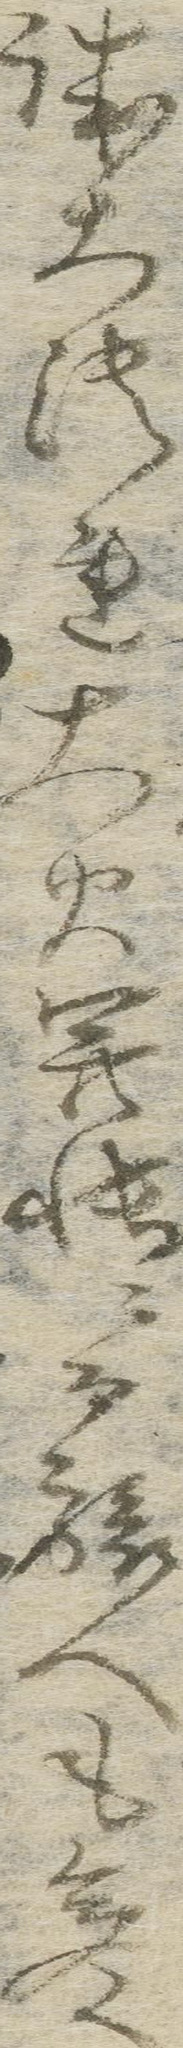誠大潰れ大火開帳二而旅人も多く
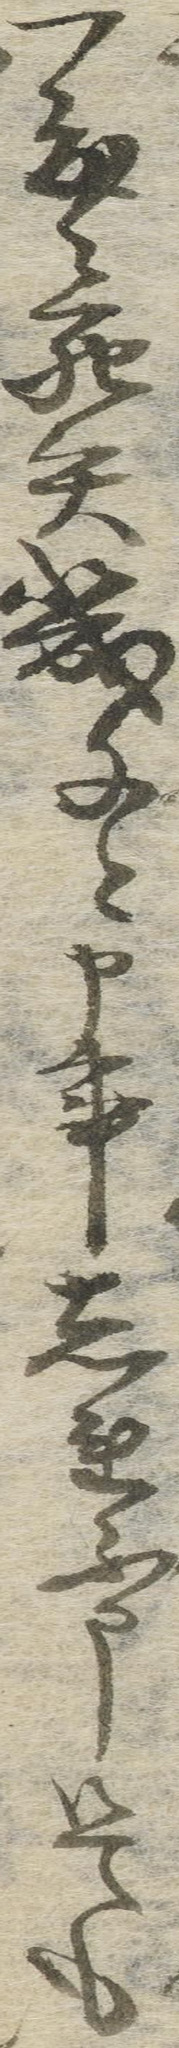今度之死失幾千と申事しれ不申是も
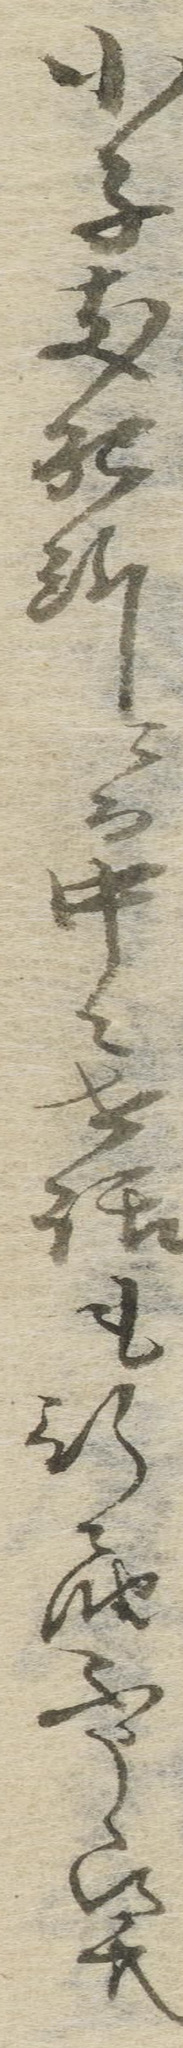小子支配所二而中々世話も行届不申候得共

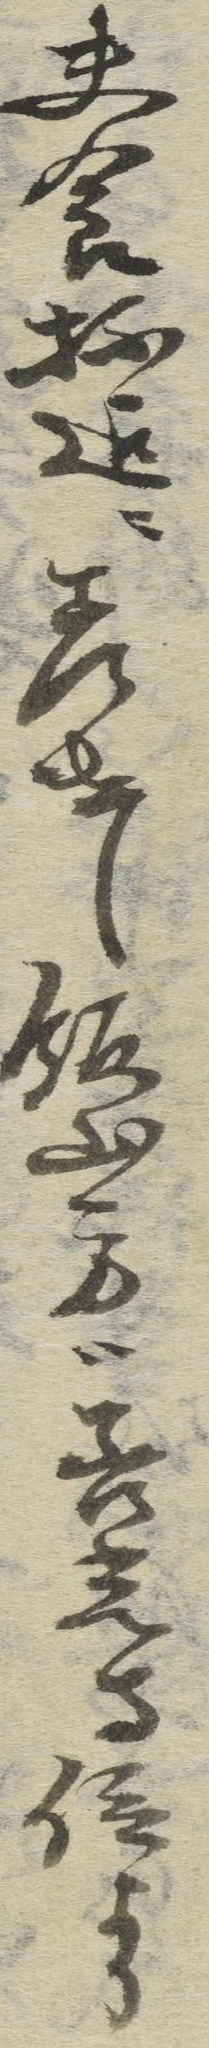夫食抔追々差遣候飯山方ハ善光寺より
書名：信濃越後　地震書留
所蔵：東京大学地震研究所図書室 Earthquake Research Institute Library, The University of Tokyo, JAPAN
